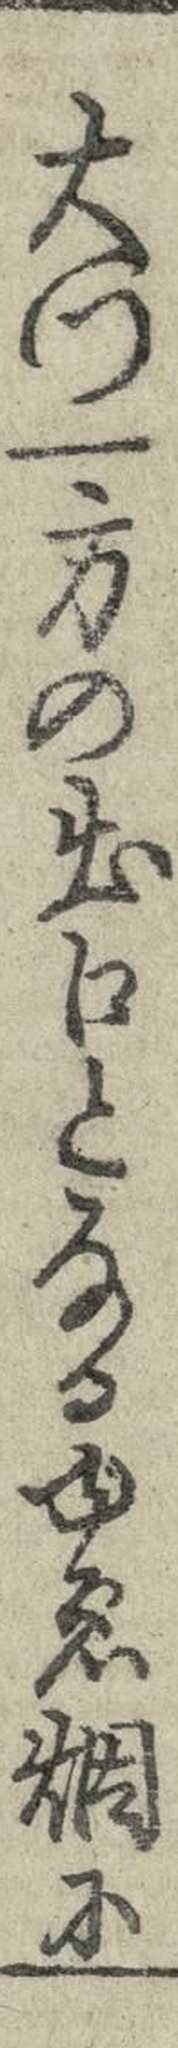大門一方の出口となるゆゑ烟に
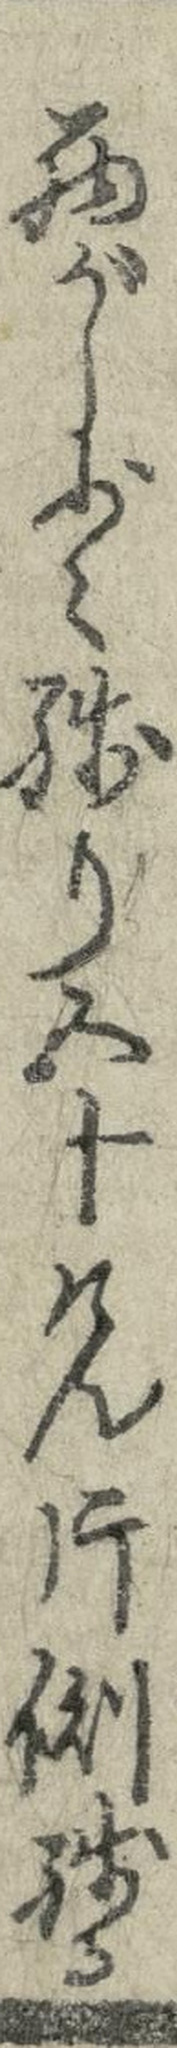西がし少々残り五十けん片側残る
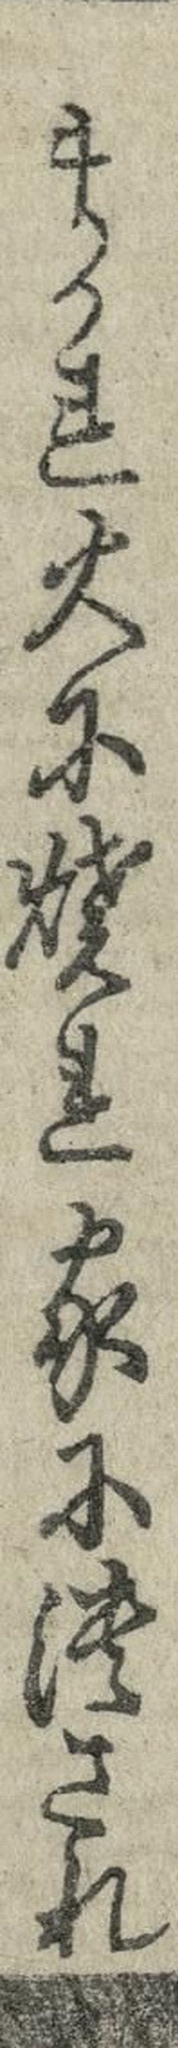まかれ火に焼れ家に潰され
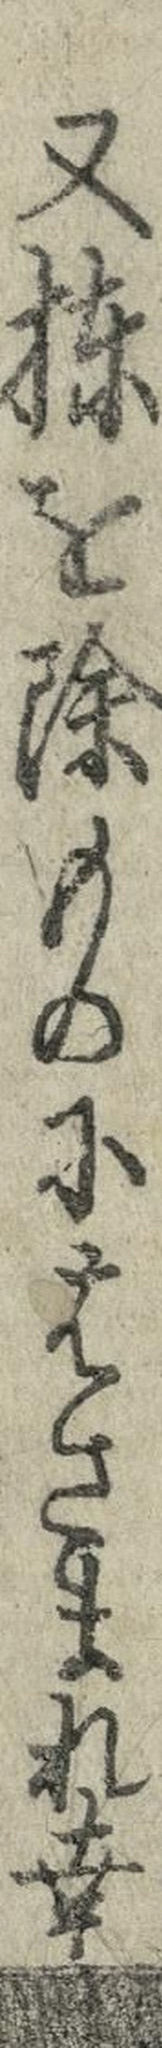又棟を除ものにはさまれ幸
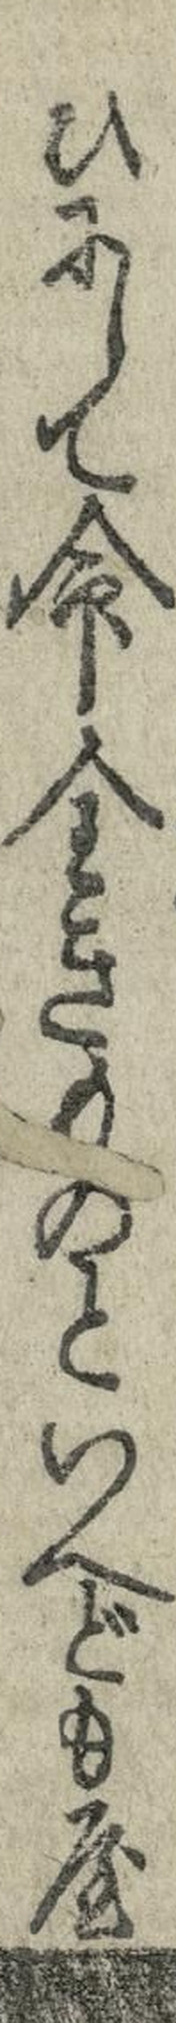ひにして命全きものといへども屋
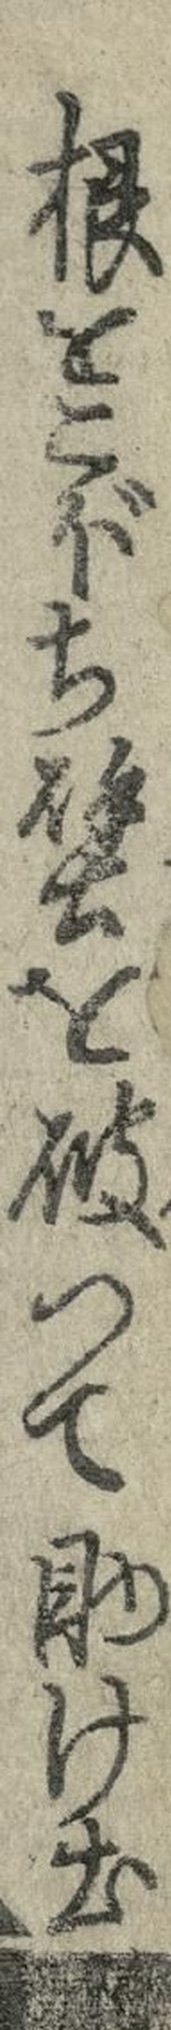根をこぼち壁を破つて助け出▲

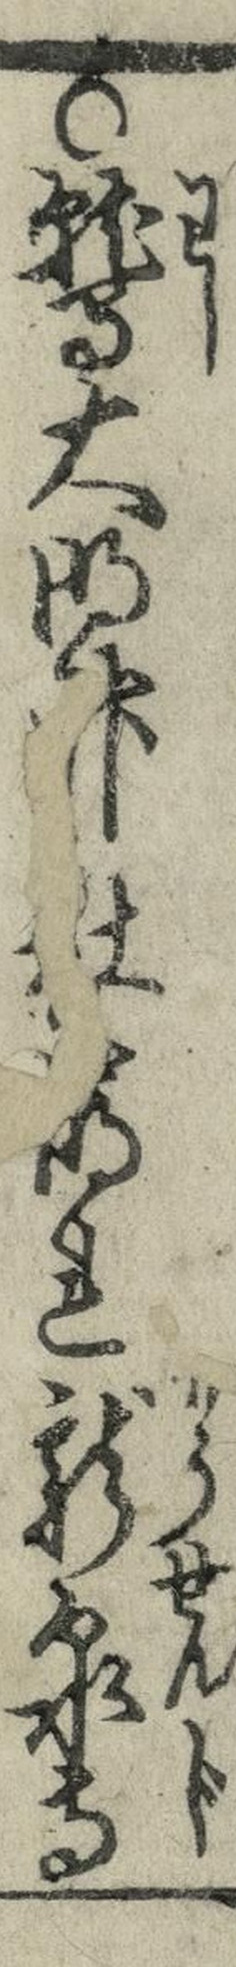○鷲大明神社崩れ龍泉寺
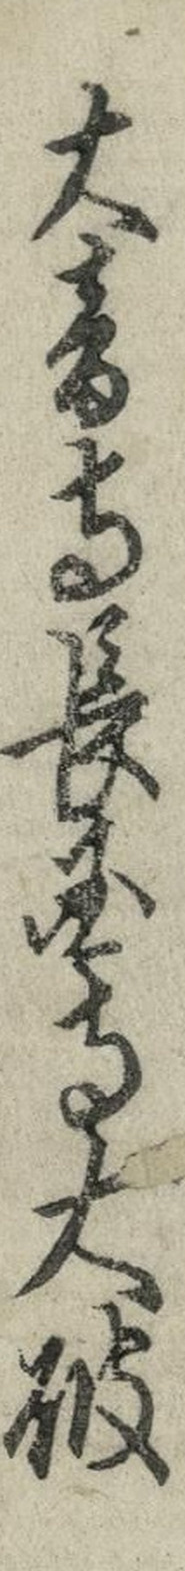大音寺長國寺大破
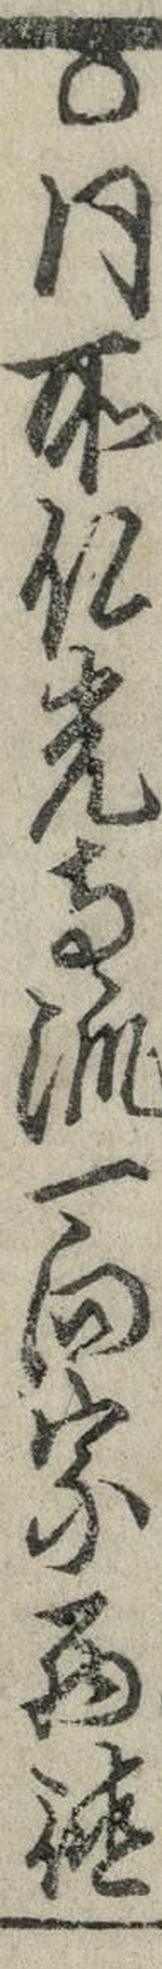○同所仏光寺派一向宗西徳
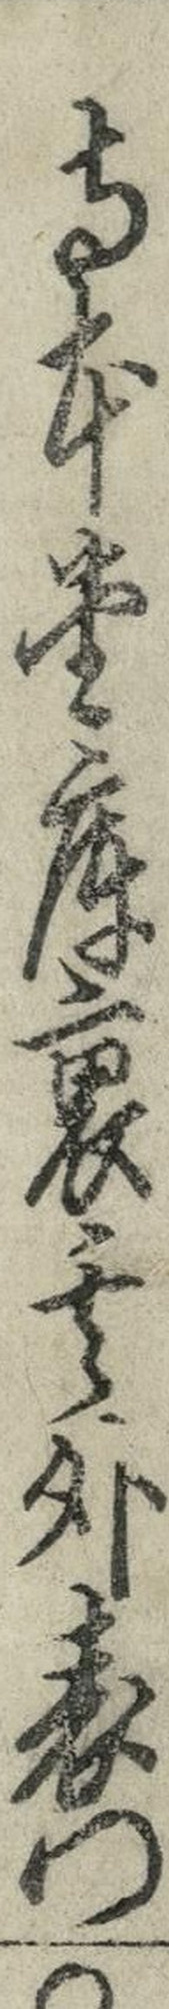寺本道庫裏其外表門
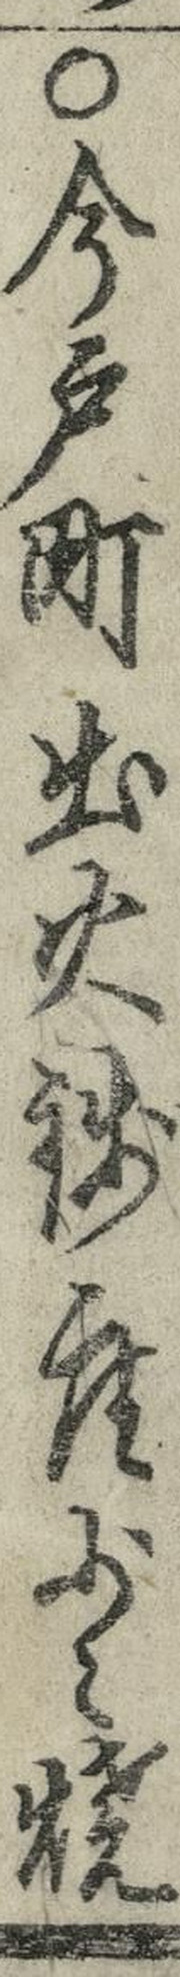○今戸町出火銭座少々焼
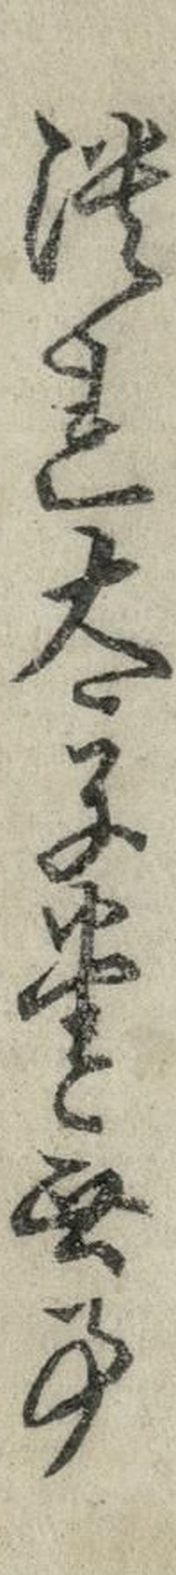潰れ太子堂無事
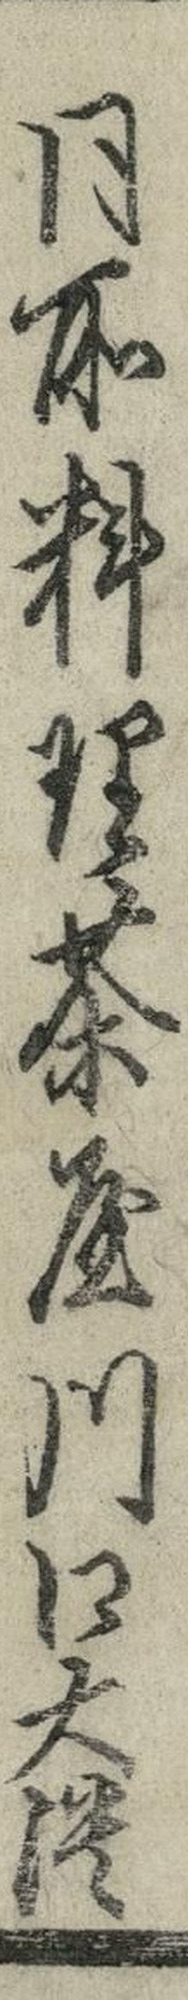同所料理茶屋川口大潰
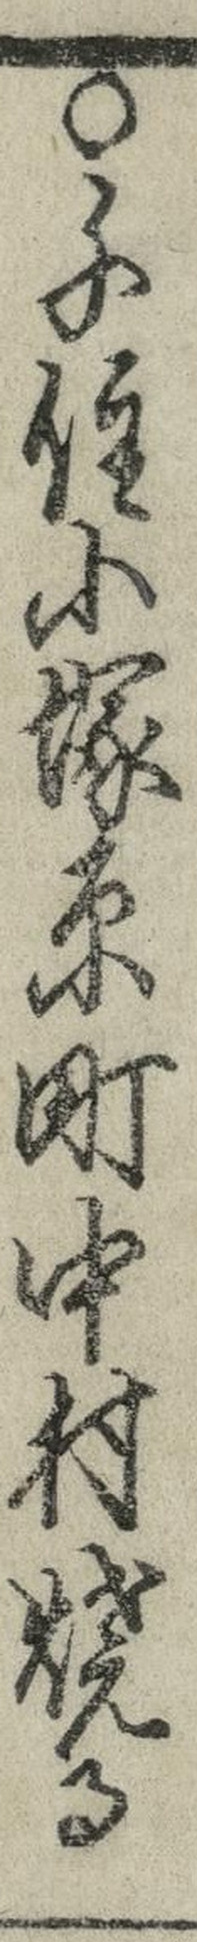○千住小塚原町中村焼る
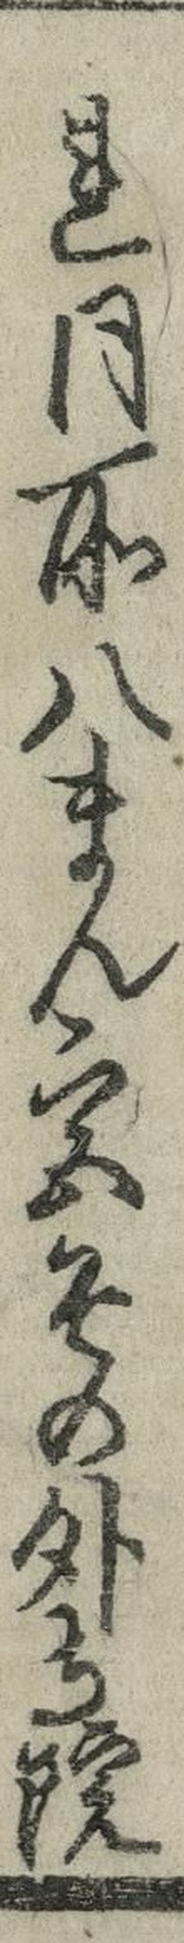れ同所八まん宮その外寺院
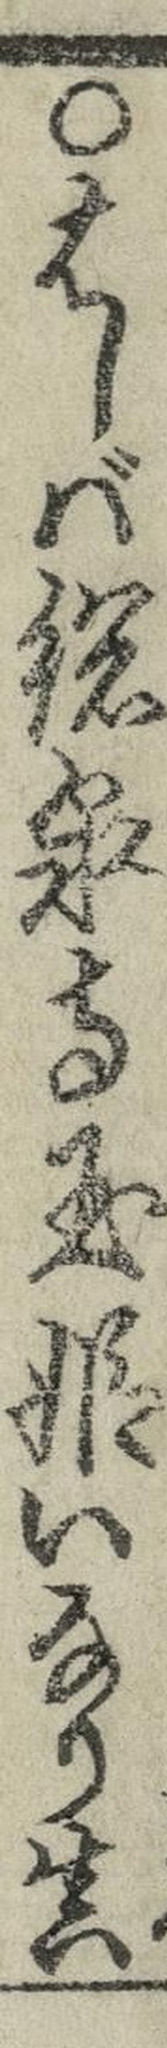○はしば総泉寺玉姫いなり真
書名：江戸　大地震末代噺の種　全
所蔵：東京大学地震研究所図書室 Earthquake Research Institute Library, The University of Tokyo, JAPAN
